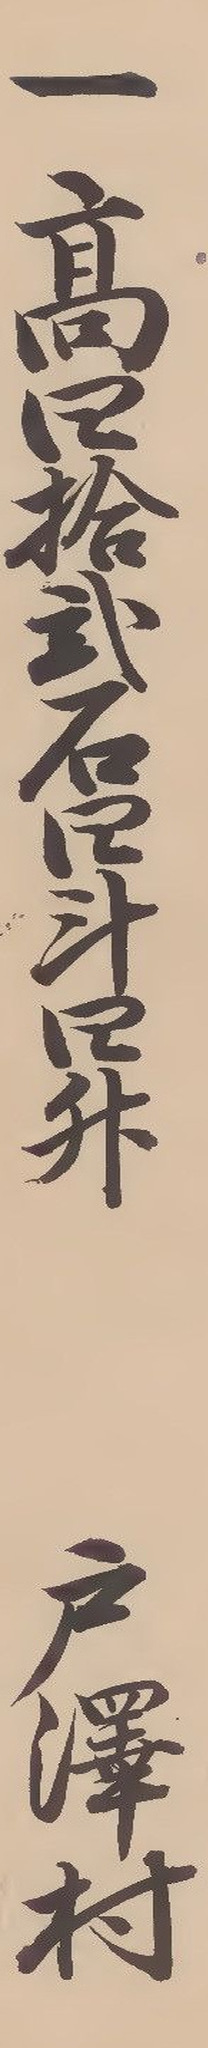一高四拾弐石四斗四升戸沢村
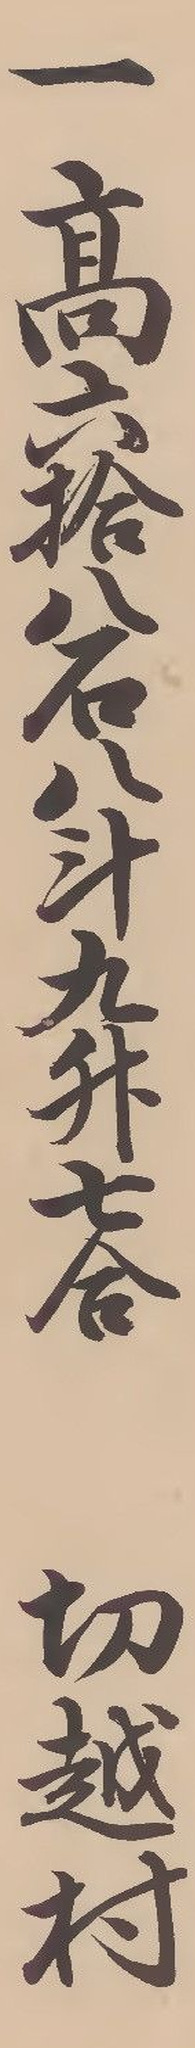一高六拾八石八斗九升七合切越村

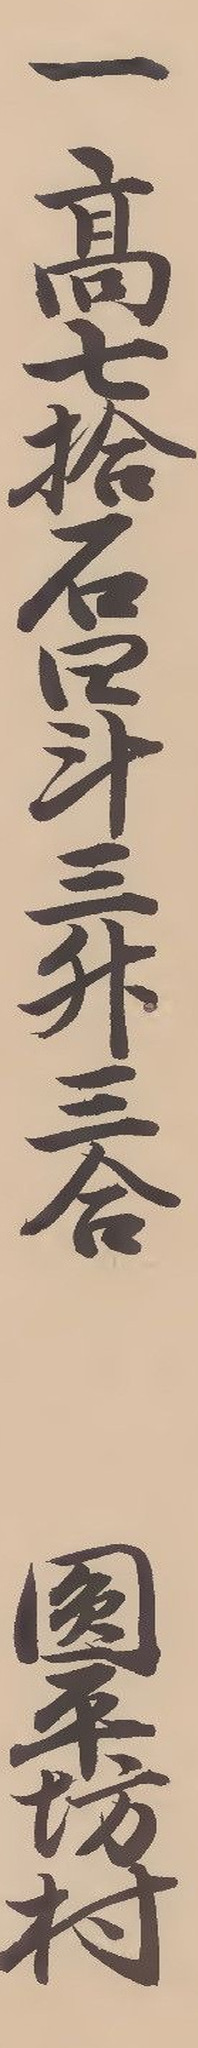一高七拾石四斗三升三合円平坊村
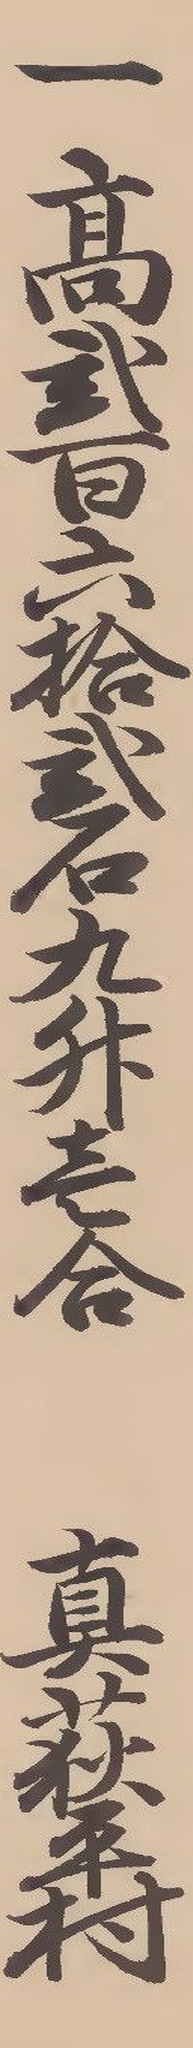一高二百六拾弐石九升壱合真荻平村
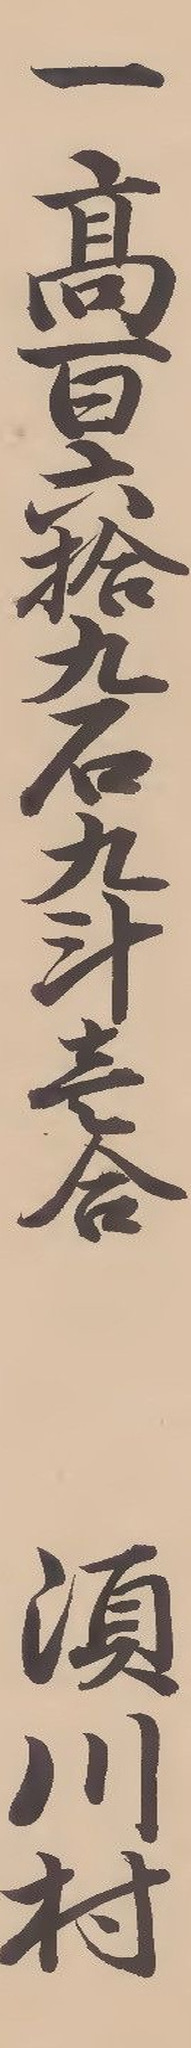一高百六拾九石九斗壱合須川村
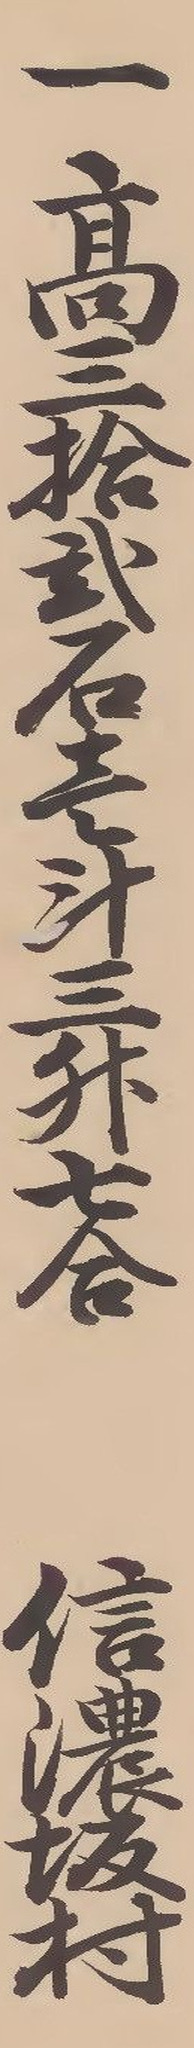一高三拾弐石壱斗三升七合信濃坂村
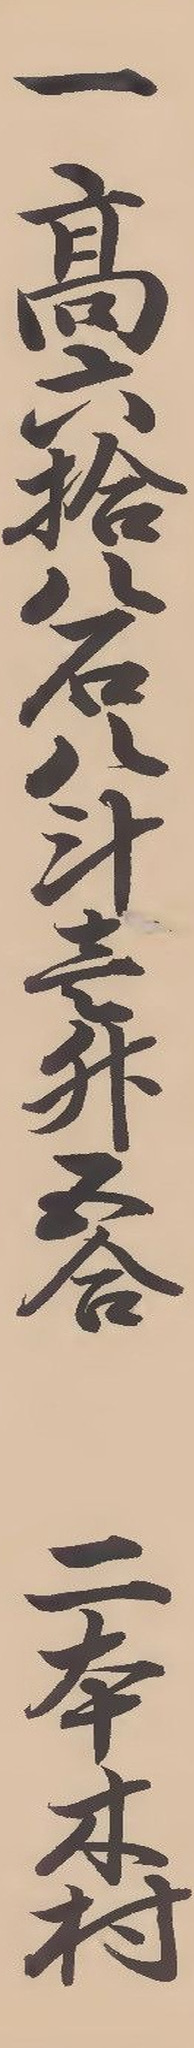一高六拾八石八斗壱升五合二本木村
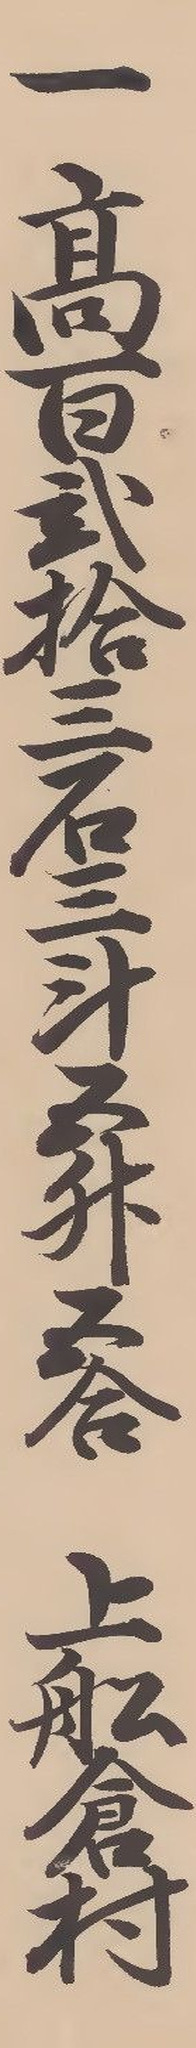一高百弐拾三石三斗五升五合上船倉村
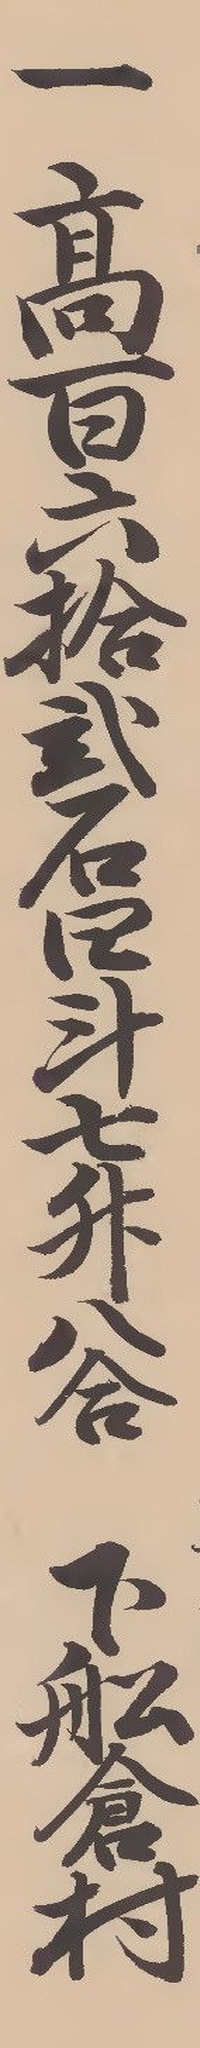一高百六拾弐石四斗七升八合下船倉村
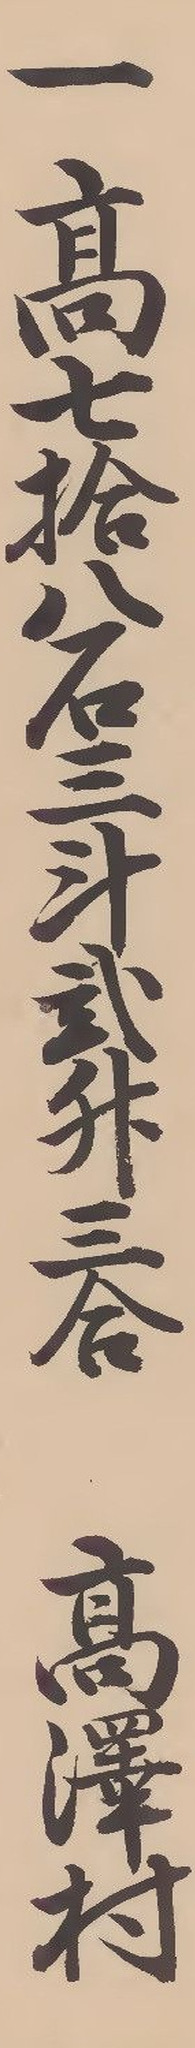一高七拾八石三斗弐升三合高沢村

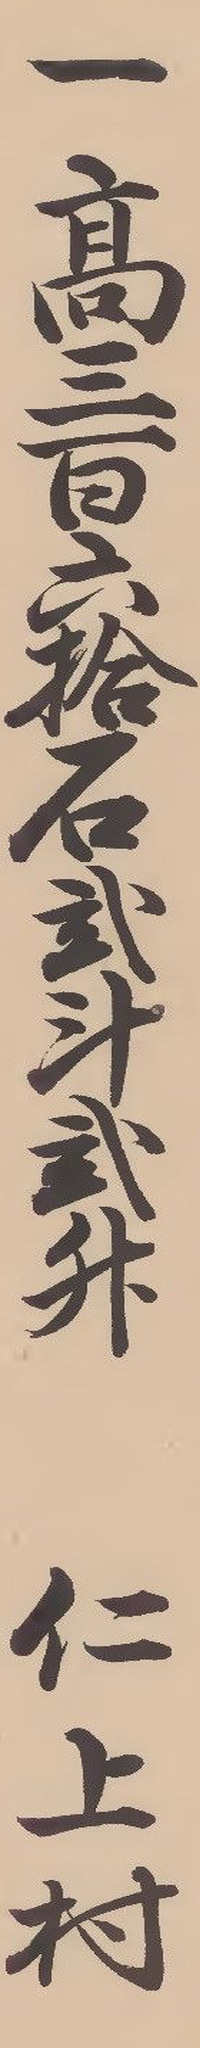一高三百六拾石弐斗弐升仁上村
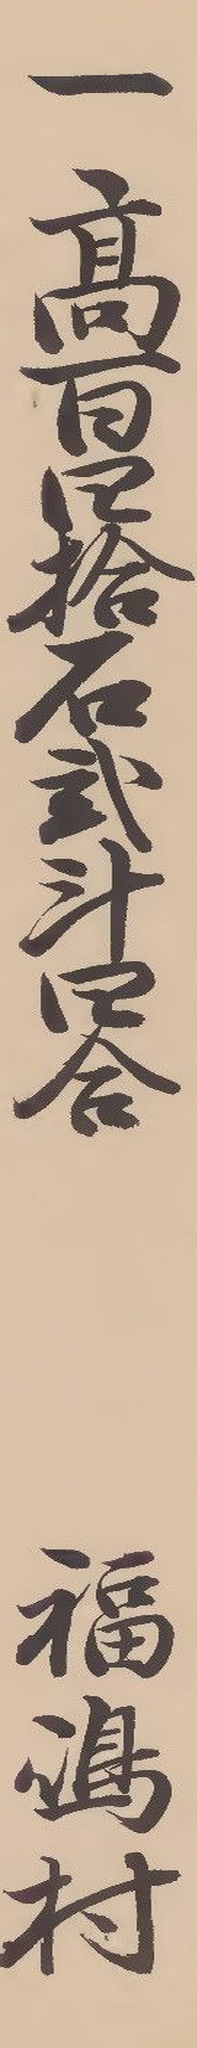一高百四拾石弐斗四合福島村
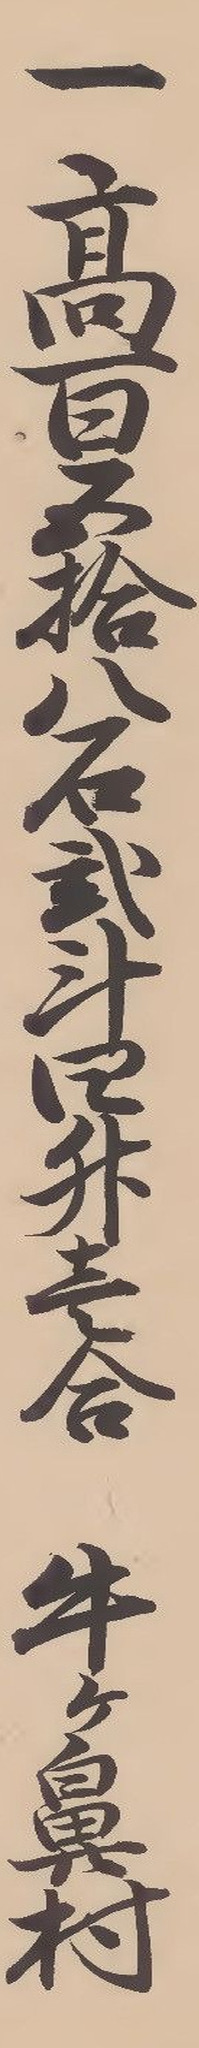一高百五拾八石弐斗四升壱合牛ヶ鼻村
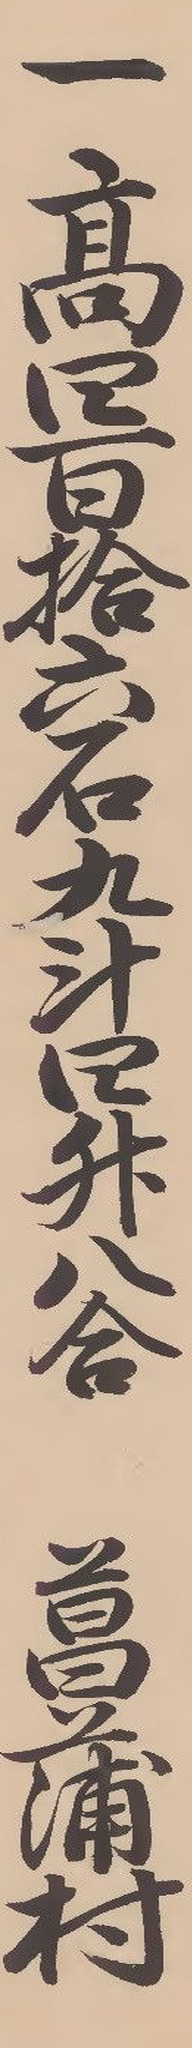一高四百拾六石九斗四升八合菖蒲村
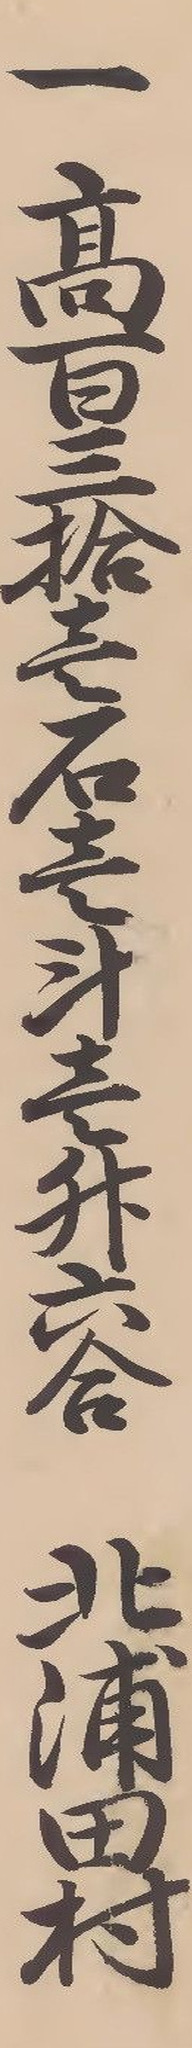一高百三拾壱石壱斗壱升六合北浦田村
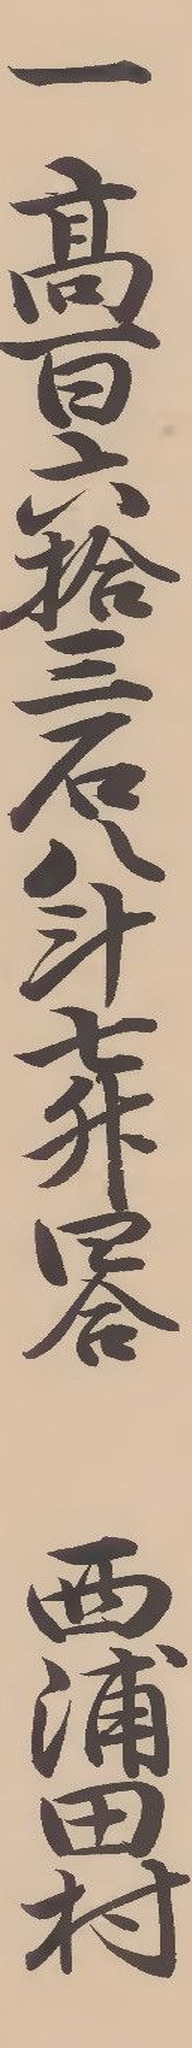一高百六拾三石八斗七升四合西浦田村
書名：越後国郷帳　上
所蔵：国立公文書館 National Archives of Japan
